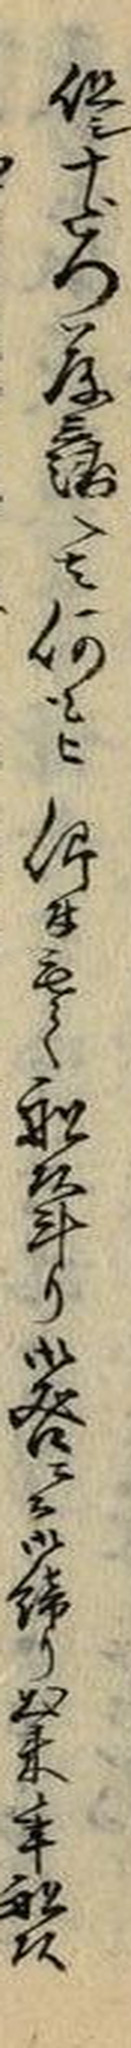但シ十郎右衛門藤兵衛へは何も被仰付無之船頭斗り御咎にて御締り出来候事船頭
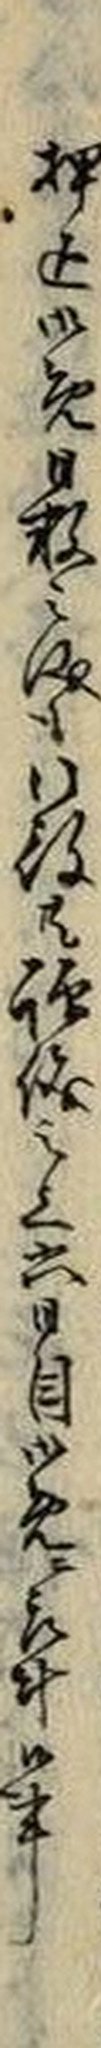押込御免日数之儀も同役共評儀之上六日目御免に取計候事
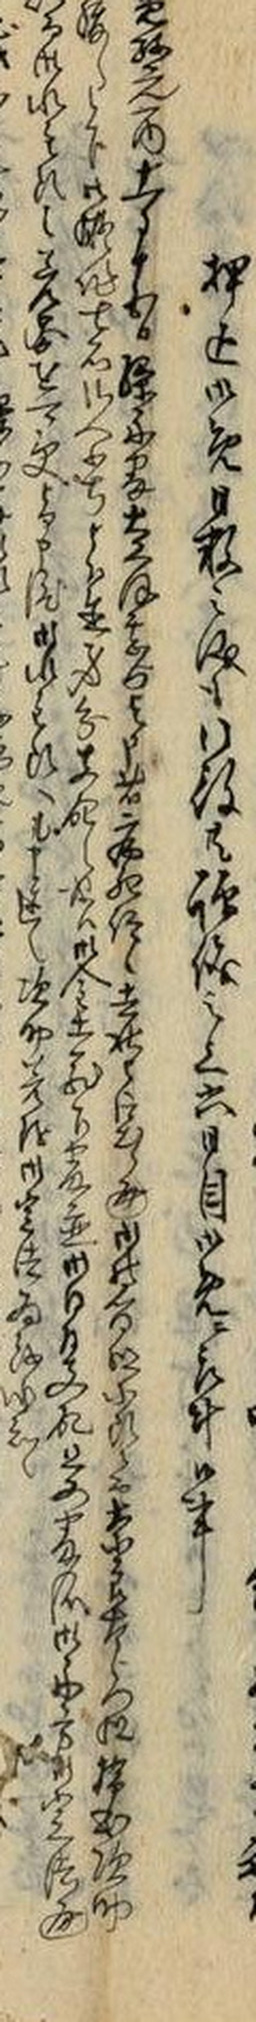一寛政元酉十一月十五日繰舟番大久保甚右衛門と申者病死跡へ去秋被仰出候通御持筒組小頭にて奈良太郎右衛門組橋本次助
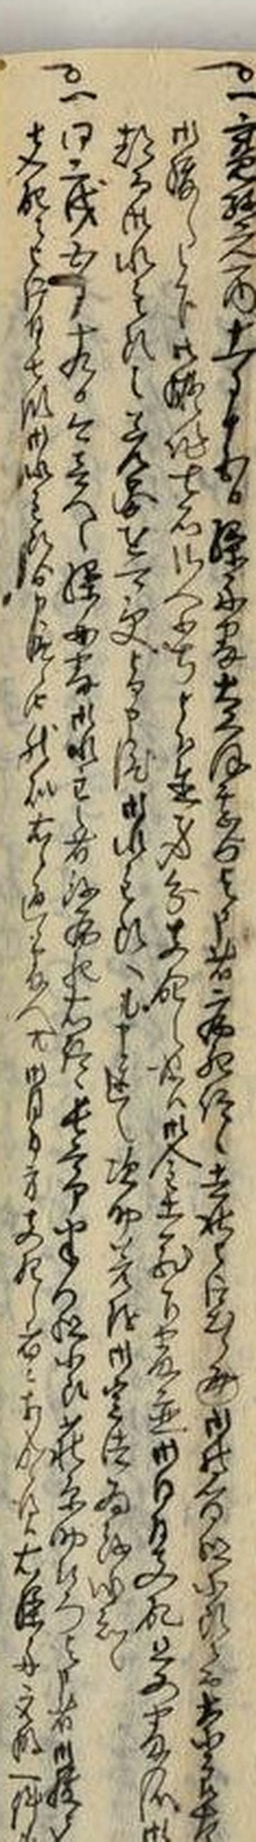都て御水主頭之差図を可受旨申渡御水主頭へも申達之次助差越御定法為致承知候
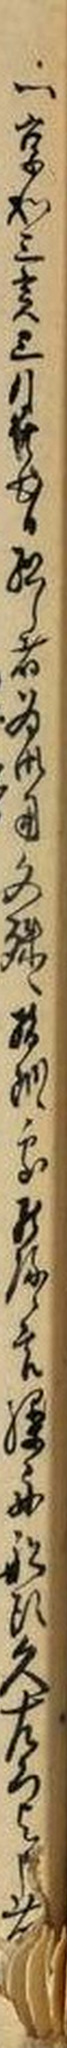一享和三亥三月廿五日組之者為御用文殊へ指越候処罷帰候節繰舟船頭久左衛門と申者
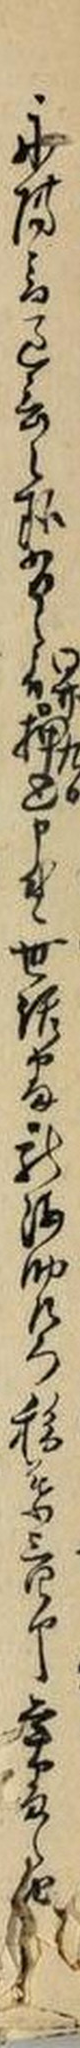舟場にて過言之趣有之に付◦同廿九日押込申付候世話番新海助左衛門稲葉三四郎年番之由
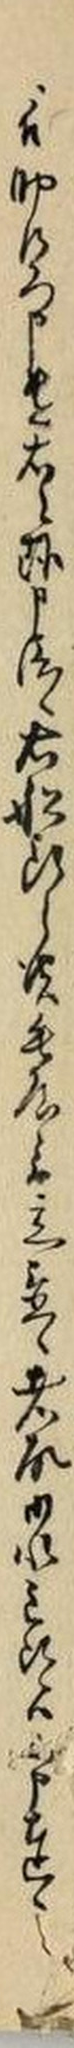に付助左衛門申遣右之趣申渡候右船頭之儀は毛屋にて立置候者故御水主頭へは不申達候
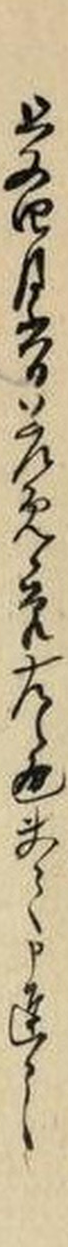且又四月六日差免候節左之通夫々へ申達之
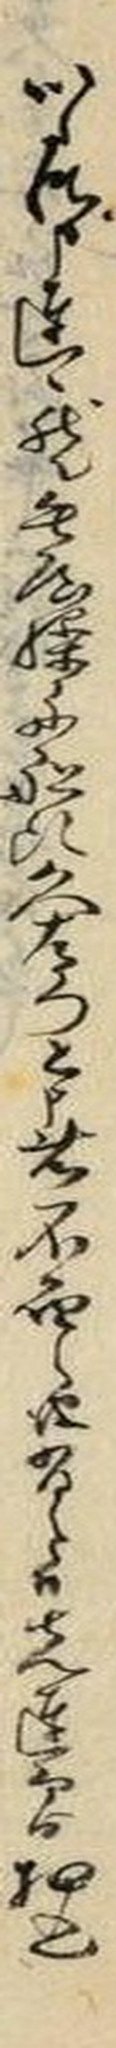以手紙申達候然は毛屋繰舟船頭久左衛門と申者不届之儀有之に付先達てゟ押込
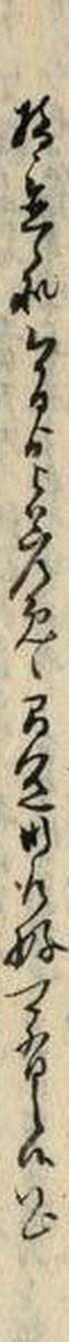指置候処今日ゟ被差免候間宜御取扱可有之候以上
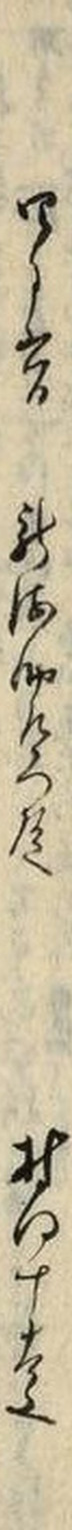四月六日新海助左衛門殿村田十大夫
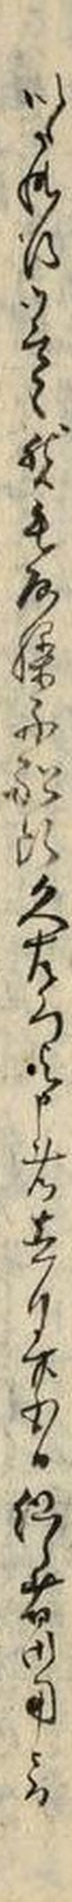以手紙得御意候然は毛屋繰舟船頭久左衛門と申者去月廿五日組之者御用にて
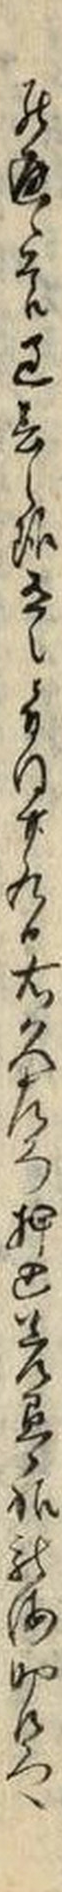罷通候節過言之趣有之に付同廿九日右久左衛門押込差置候様新海助左衛門へ
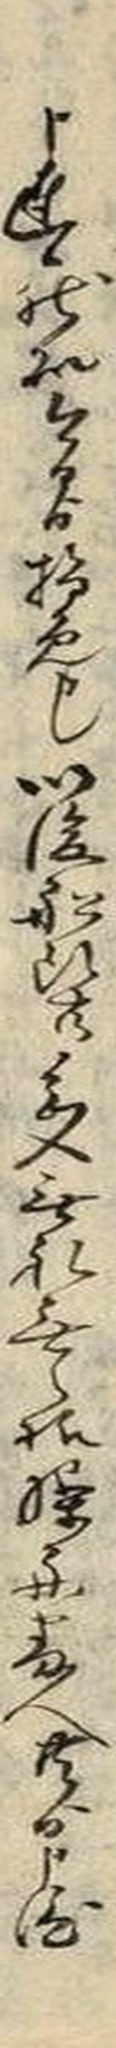申達候然処今日ゟ指免申候以後船頭共念入無礼無之様繰舟番人共ゟ申渡
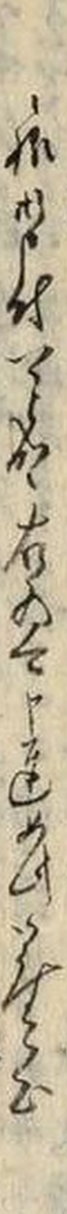候様御申付可被成候右為可申達如此御座候以上
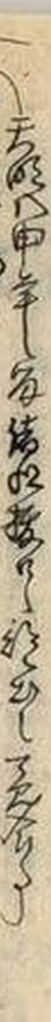天明八申年之留諸組援口之部へ出し可見合事
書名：御城下諸事之部
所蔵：福井県文書館 Fukui Prefectural Archives
